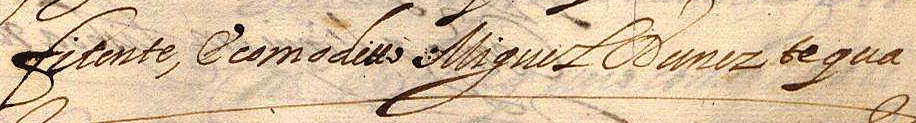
fitente, e com o ditto Miguel Nunez te qua
